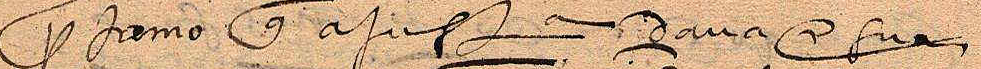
p̄o termo q̄ a Justa daua ē sua
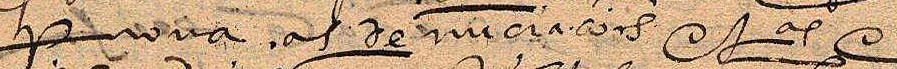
proua as den̄uçiações e tas e
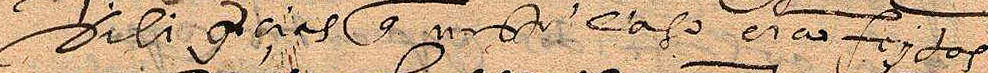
diligēçias q̄ neste caso erão feytas
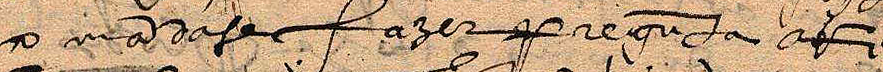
e mādase fazer preḡuta a Re
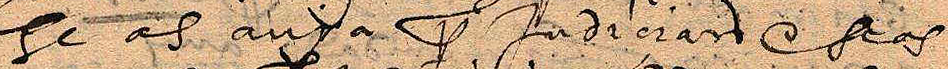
se as auya p̄o Judiçiaes e se as
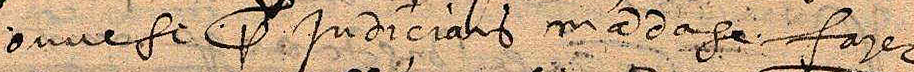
ouuese p̄o Judiçiaes mādase fazer
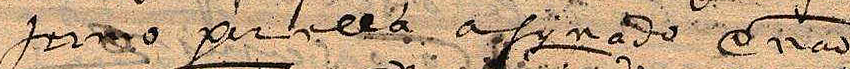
termo per ella asynado e não
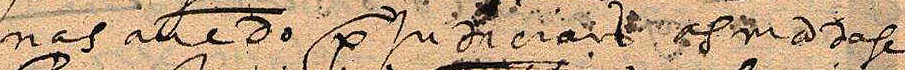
nas aūendo p̄o Judiçiaes as mādase
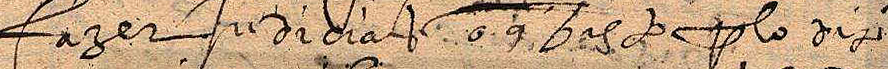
fazer Judiçiaes o q̄ visto p̄lo dito
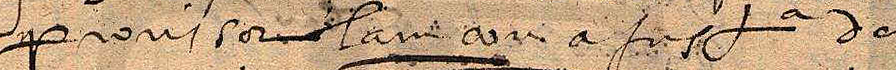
prouisor lamcou a Justa da
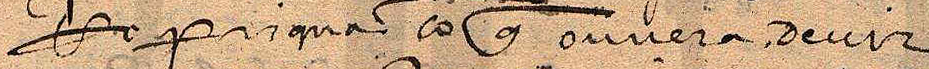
Repriqua c̄o q̄ ouuera de uir
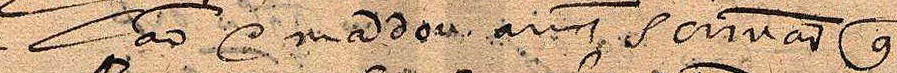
Ção e mādou a mī scriuão q̄
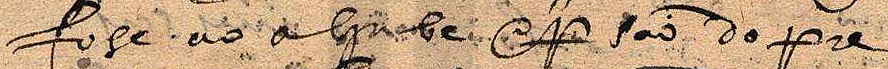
fose ao aljube e p̄são do pre
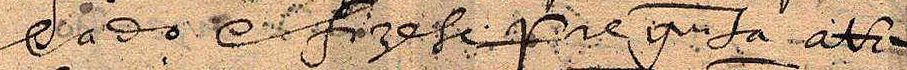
lado e fizese preḡuta a Re
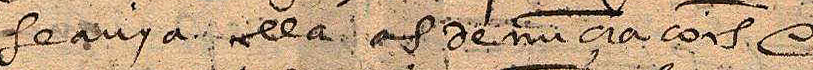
se auya ella as den̄uçiações e
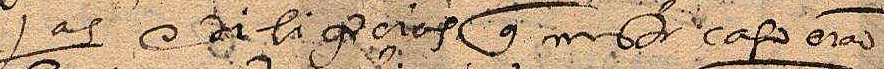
tas e diligēçias q̄ neste caso erão
